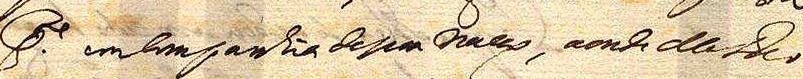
pt.e em companhia de sua naçaõ, aonde elle Reo
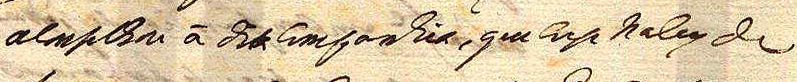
aconselhou à dita companhia, que crese na ley de
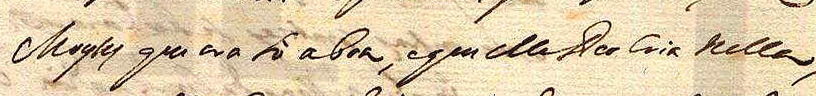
Moyses que era só a boa, e que elle Reo cria nella,
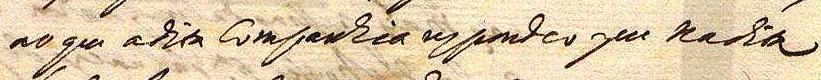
ao que a dita companhia respondeo que na dita
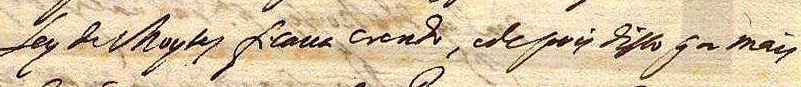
Ley de Moyses ficaua crendo, e depois disso q̄ a mais
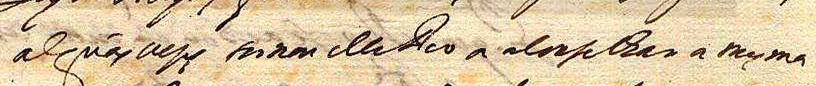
alguās ueses tornou elle Reo a aconselhar a mesma
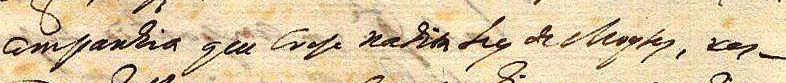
companhia que crese na dita Ley de Moyses, res
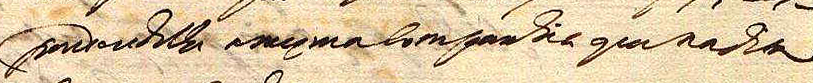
pondendolhe a mesma companhia que na dita
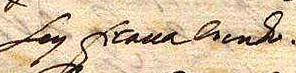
Ley ficaua crendo.
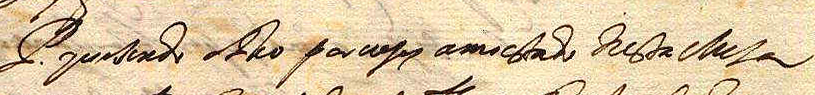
P. que sendo o Reo por ueses amoestado nesta Mesa
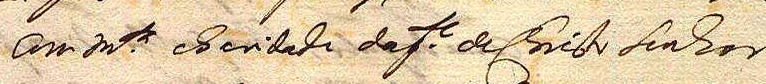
com m.ta charidade da p.te de Christo Senhor
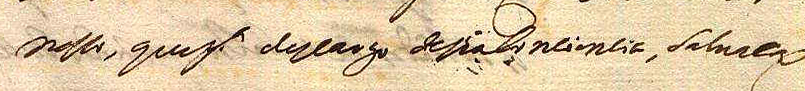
nosso, que p.a descargo dessa conciencia, saluaçaõ
